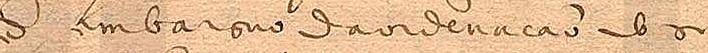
sē embarguo da ordenaçaõ do se
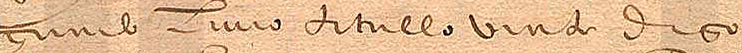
gundo Liuro titullo vinte digo
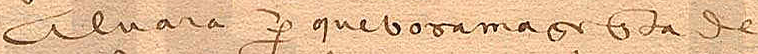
Aluara ꝑ que vosa magestade
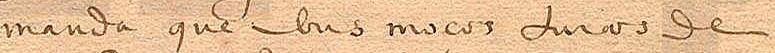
manda que dous moços turcos de
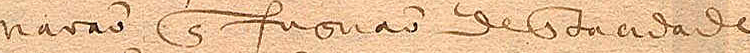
naçaõ q̄ fugiraõ desta cidade
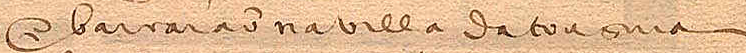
e ēbarcaraõ na villa datouguia
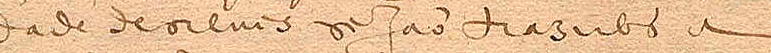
dade de silues seJaõ trazidos a
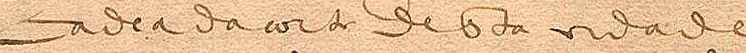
Cadea da corte desta cidade
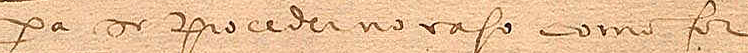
ꝑa se proceder no caso como for
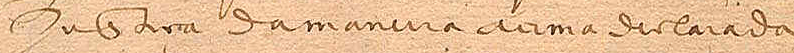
Justiça da maneira acima declarada
